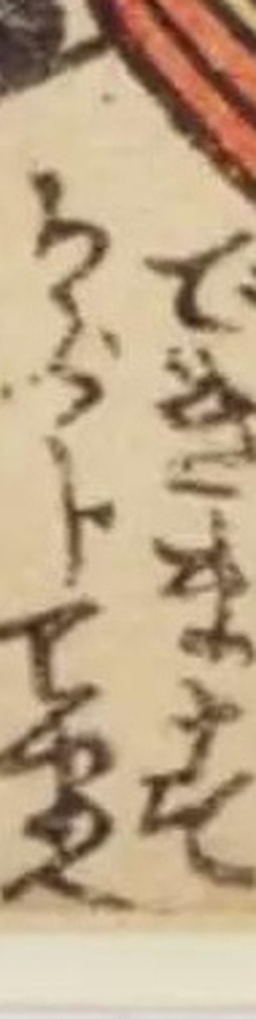からトてまへ
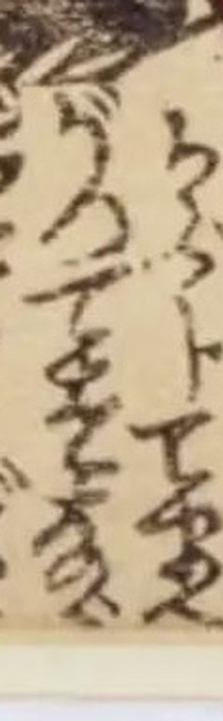がつてをな
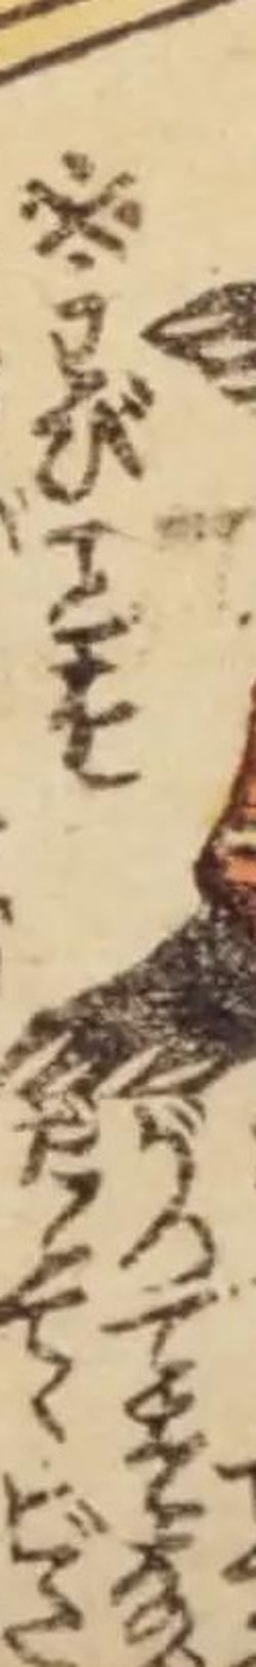※わびことを
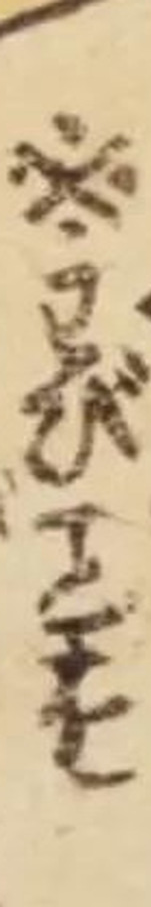※わびことを
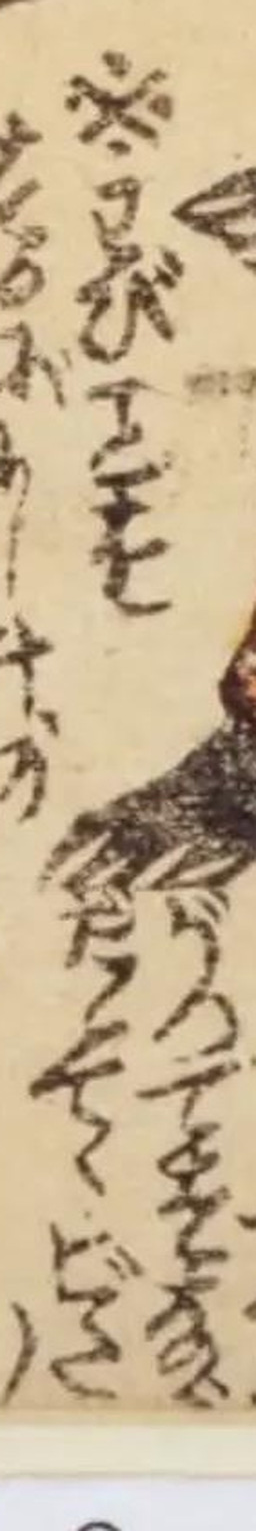※わびことを
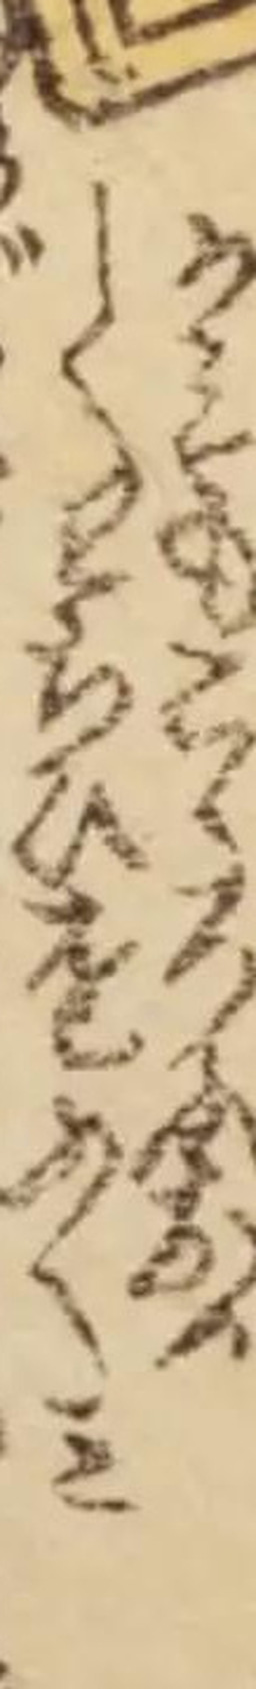しくわらひをふくみ
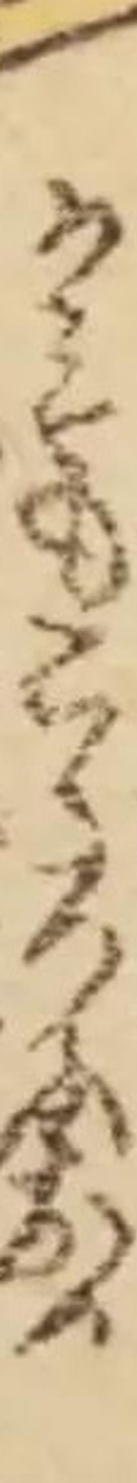かみもこゝろにおか
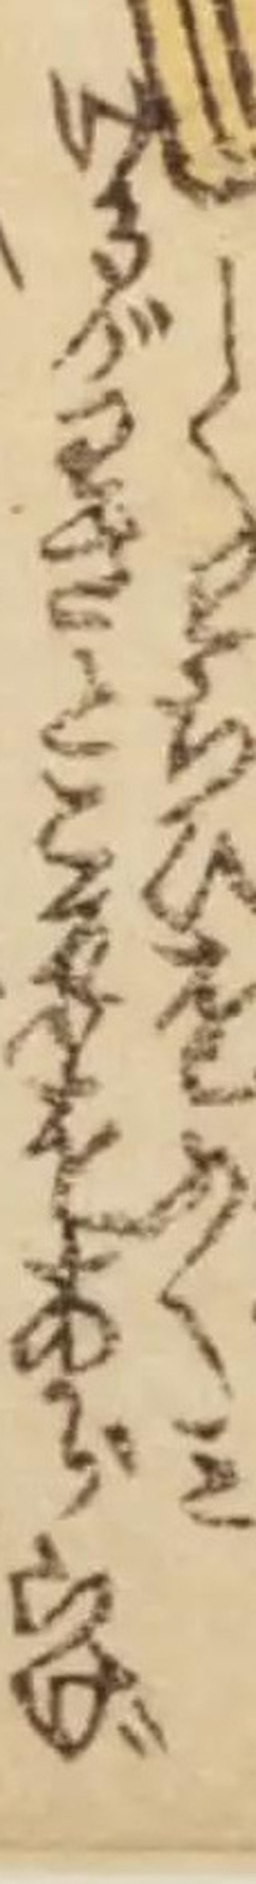けるがわざとこえをあららげ
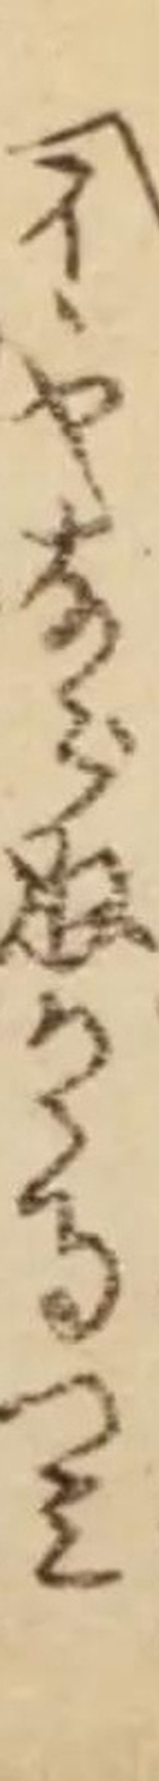「イヽヤならぬかゝるつみ
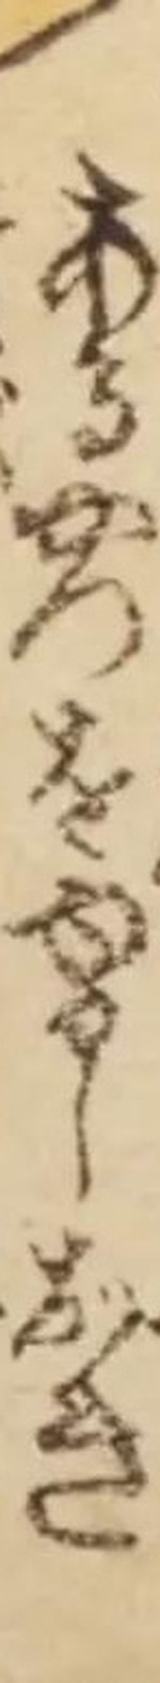あるやつをゆるしおき
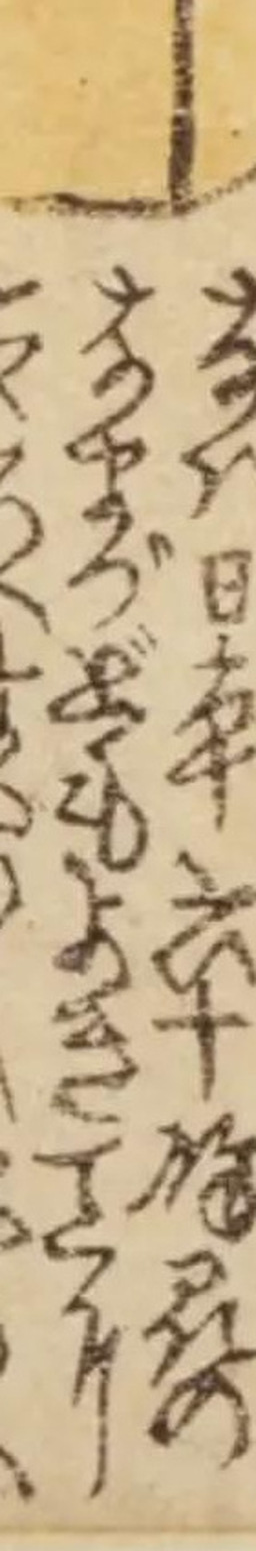なまづどもよきことに
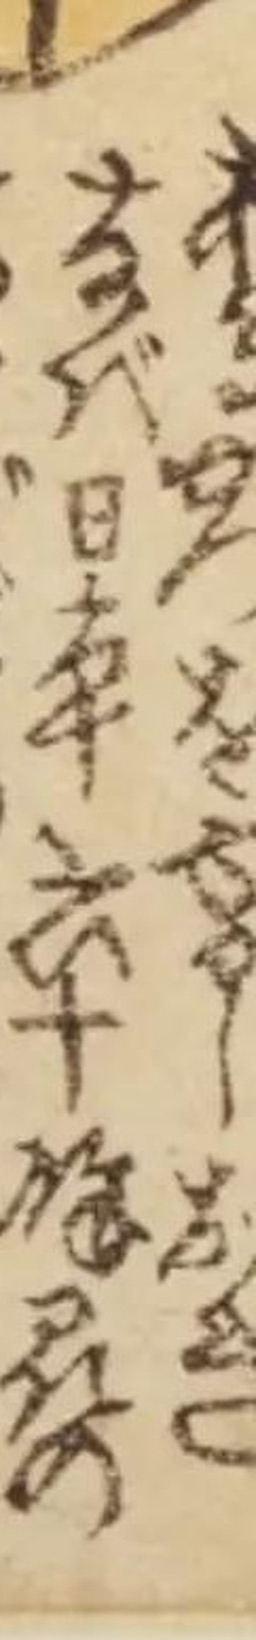なば日本六十余州の
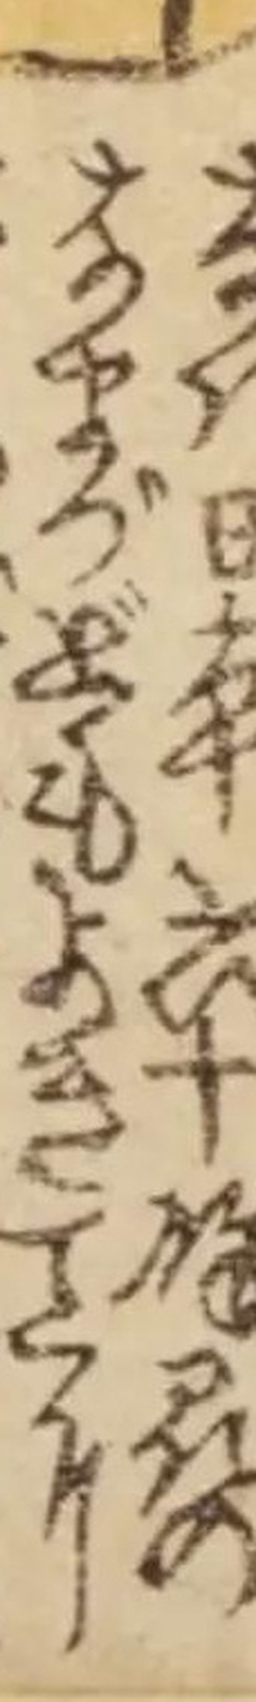なまづどもよきことに
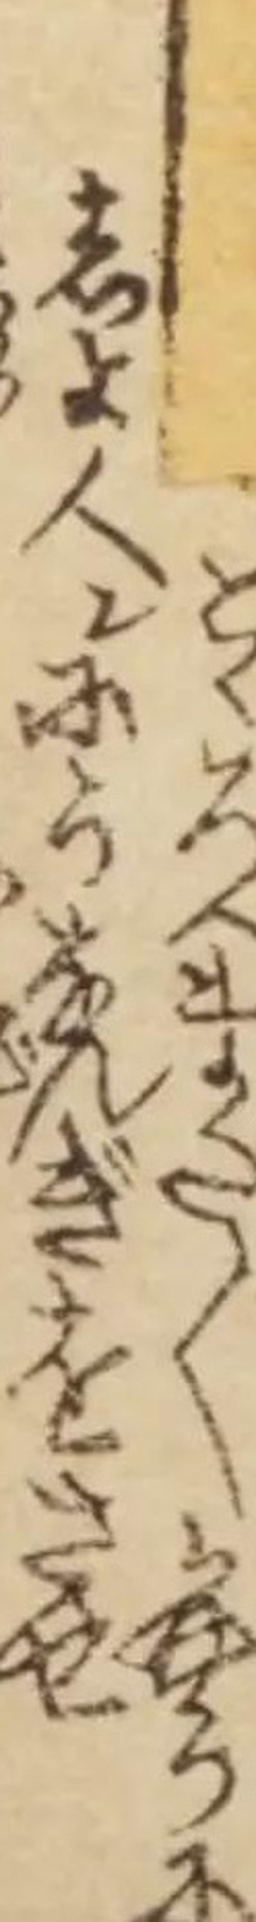しよ人ンにうなんぎをさせ
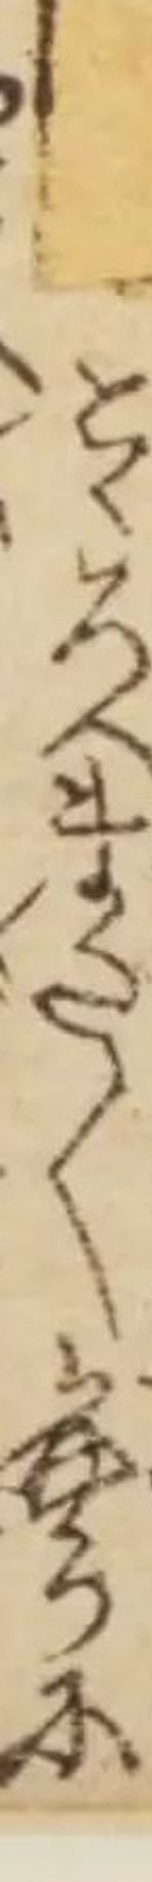こゝろへまた〳〵かやうに
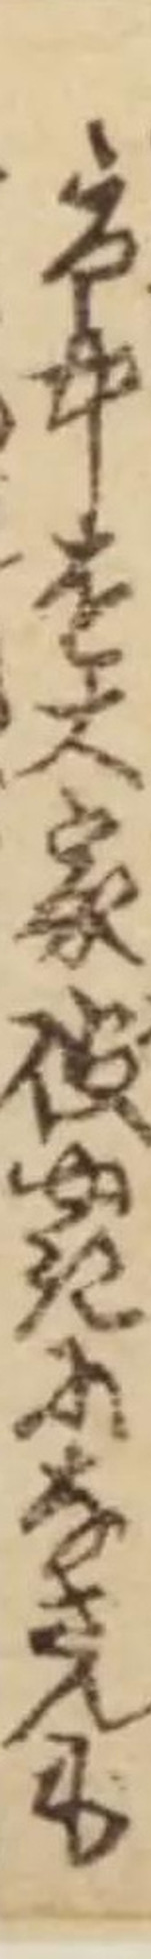市中を大家破やきになさんも
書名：生捕ました三度の大地震
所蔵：国立国会図書館 National Diet Library, JAPAN
